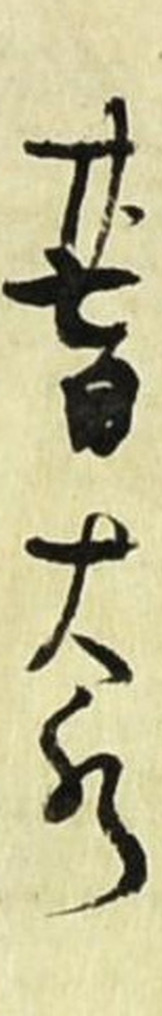廿七日大水

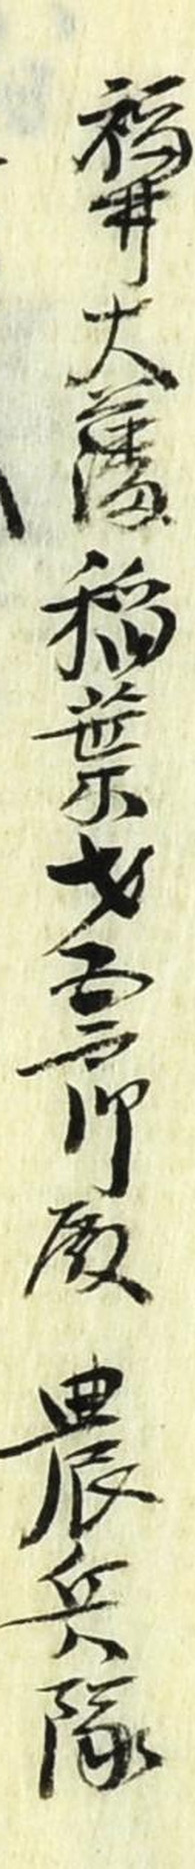福井大藩稲葉歳五郎殿農兵隊
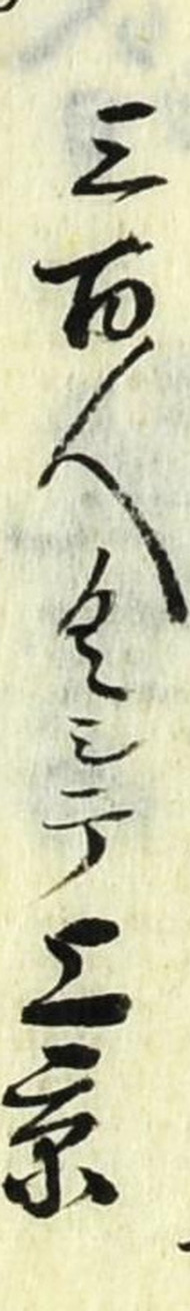三百人具シテ上京
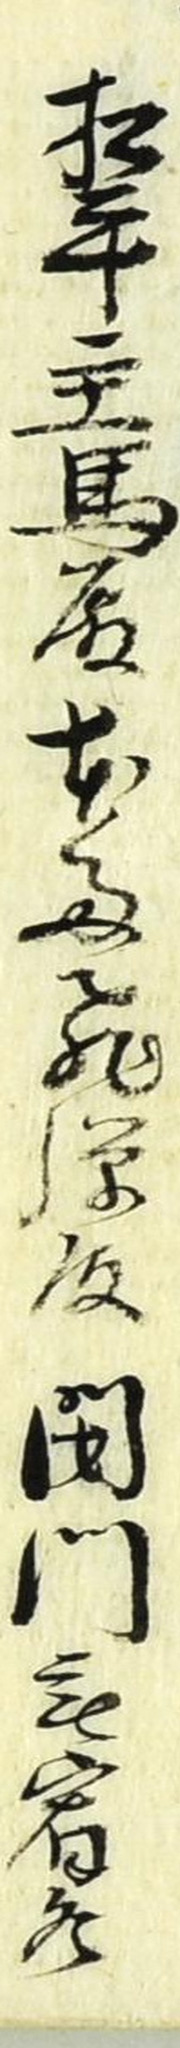松平主馬殿本多飛騨殿閉門被宥候
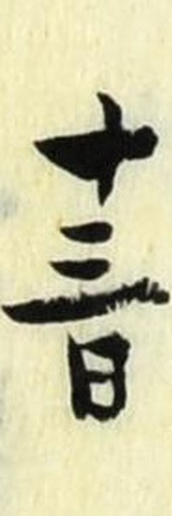十三日
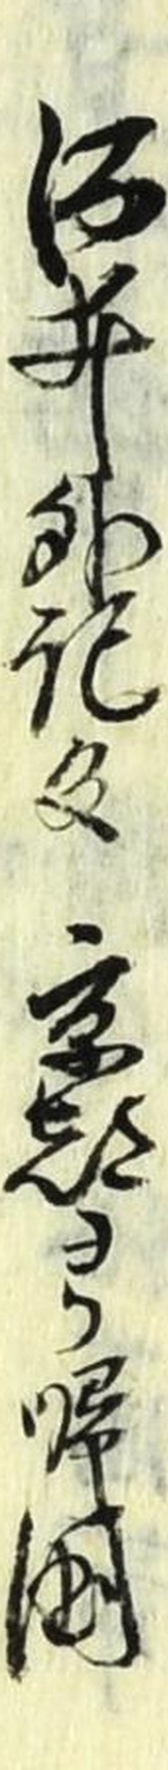酒井外記殿京都ヨリ帰国
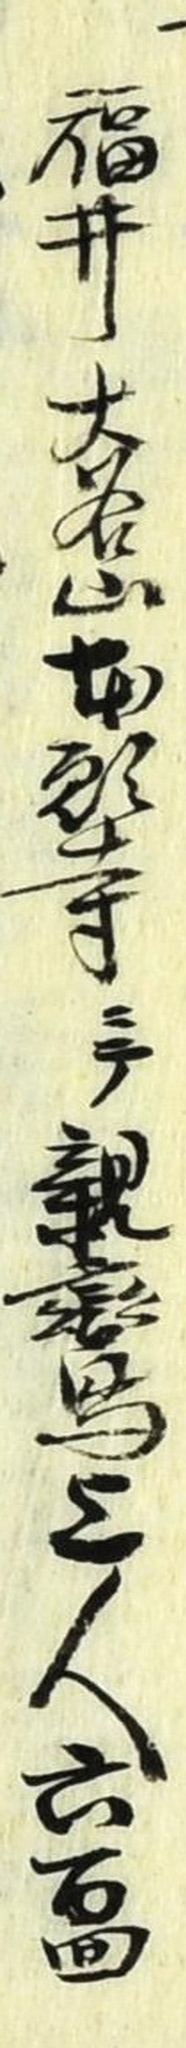福井大谷山本願寺ニテ親鸞上人六百回
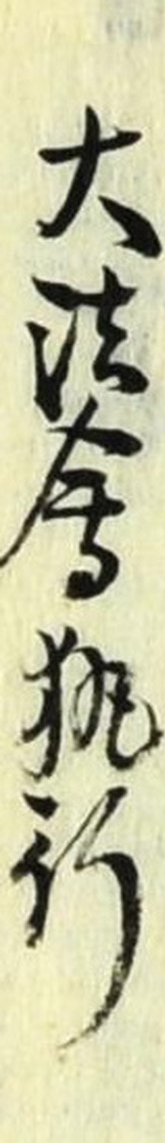大法会執行
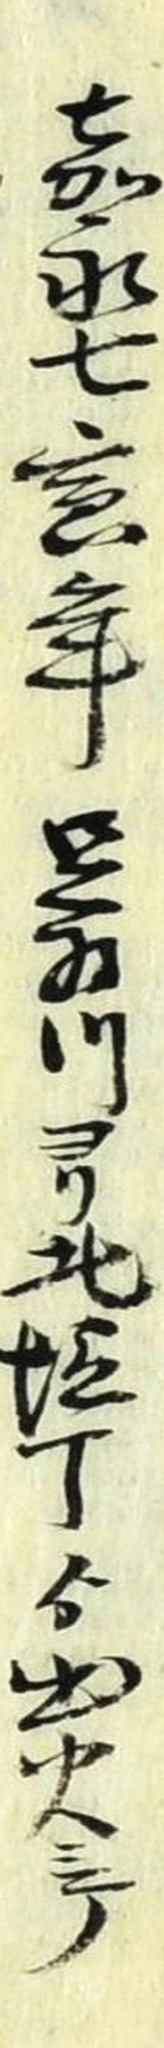嘉永七寅年足羽川ヨリ北塩丁ゟ出火ニテ
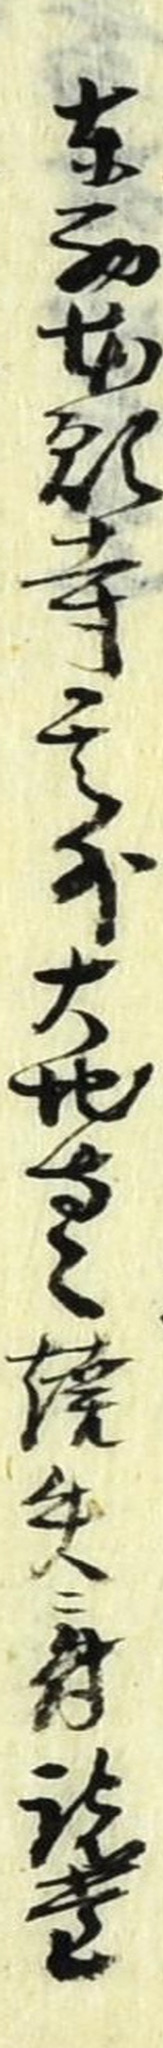東西本願寺其外大地寺々焼失ニ付諸堂
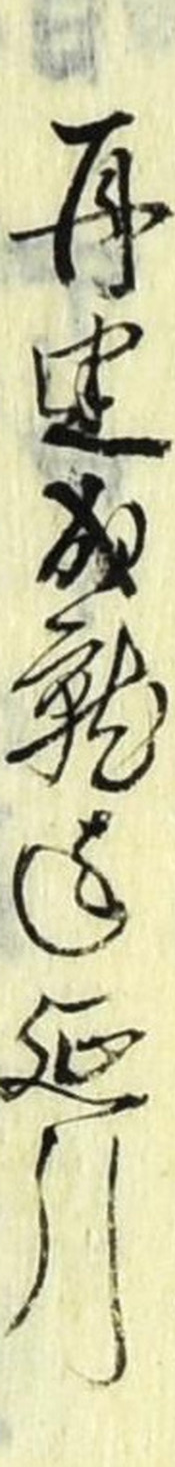再建成就迄延引
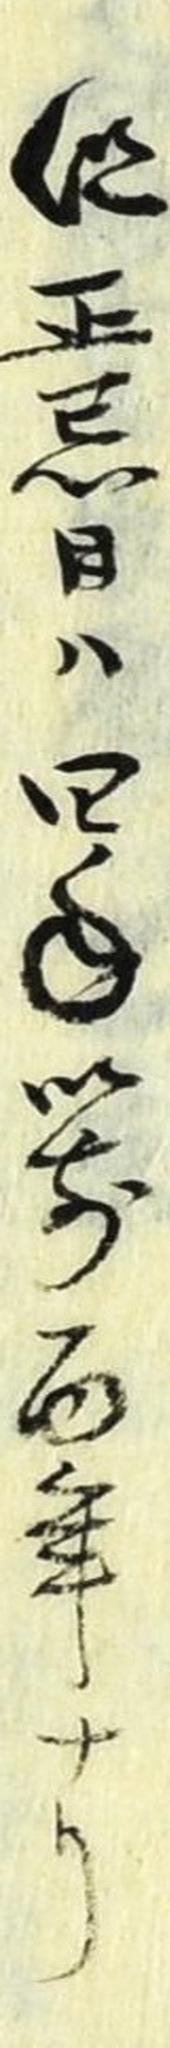但正忌日ハ四年以前百年ナリ
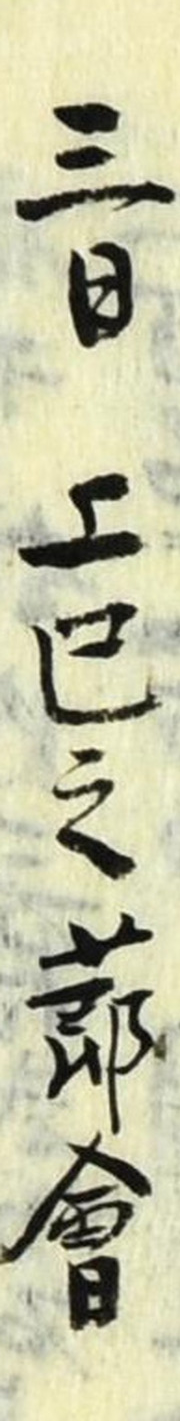三日上巳之節会
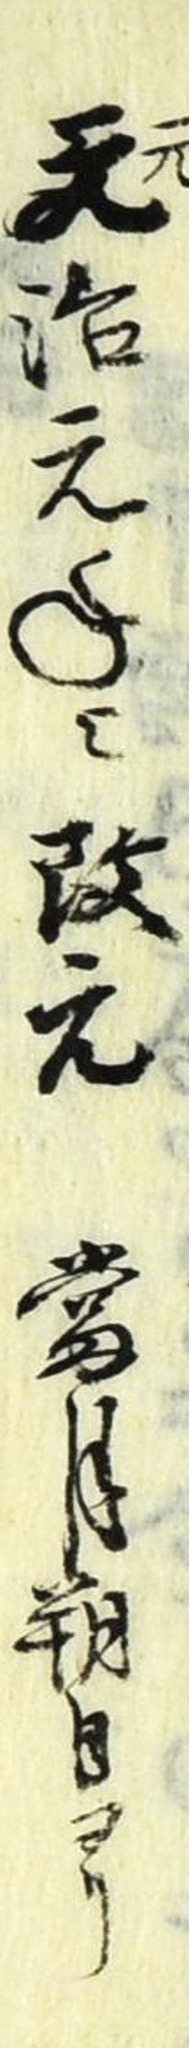天治元年と改元当月朔日ヨリ
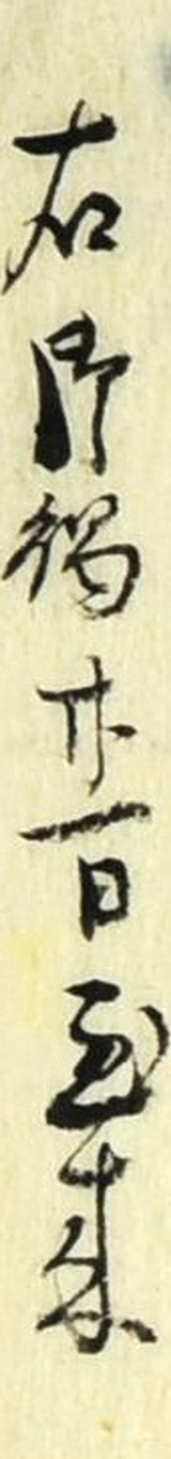右御触廿一日到来

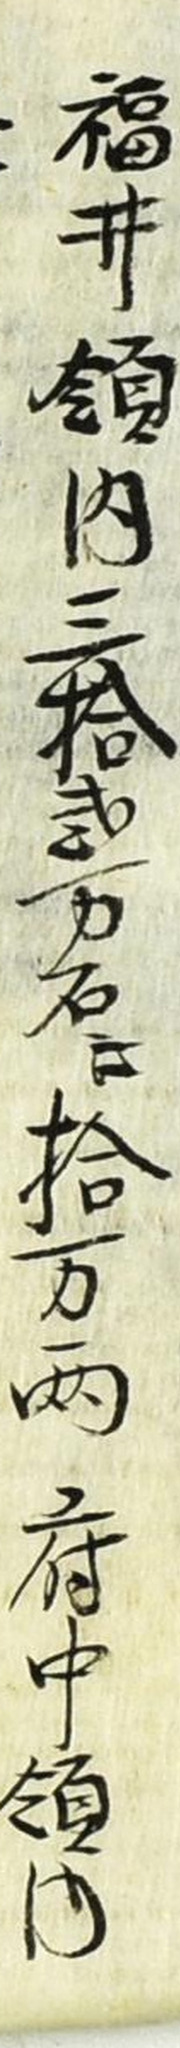福井領内三拾弐万石ニ拾万両府中領内
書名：（日記）
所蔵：福井県文書館 Fukui Prefectural Archives
